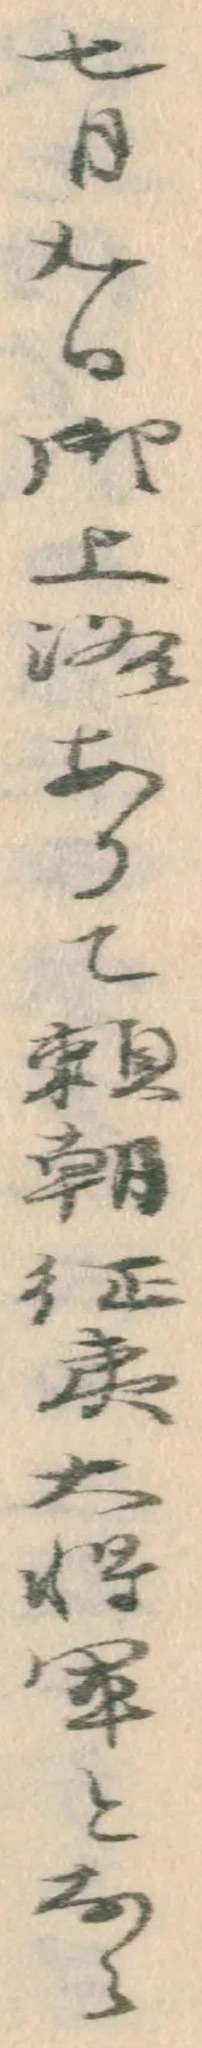七月九日御上洛ありて頼朝征夷大将軍となら
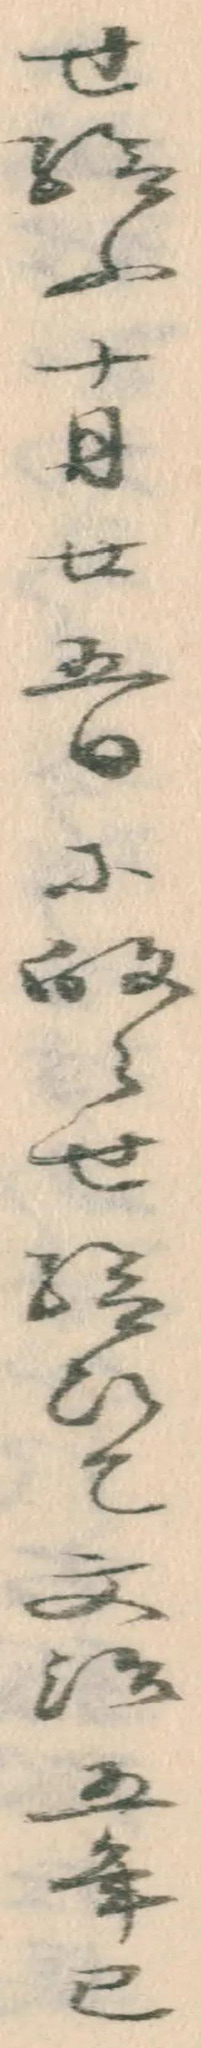せ給ふ十月廿五日に皈らせ給ひて文治五年己
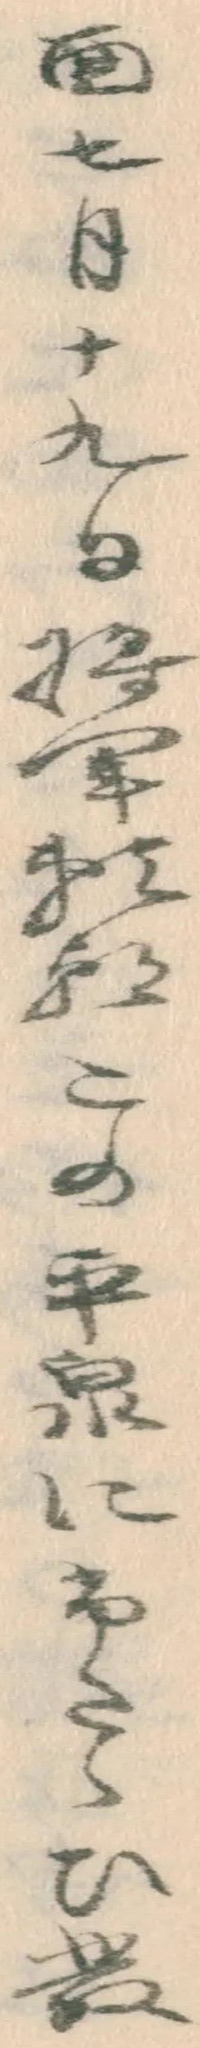酉七月十九日将軍頼朝この平泉にふたゝに發
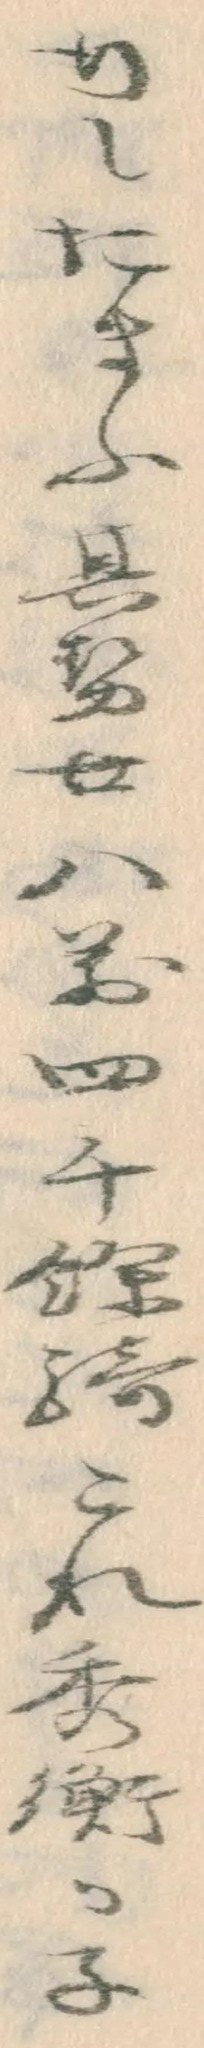行したまふ其㔟廿八萬四千餘騎これ秀衡か子
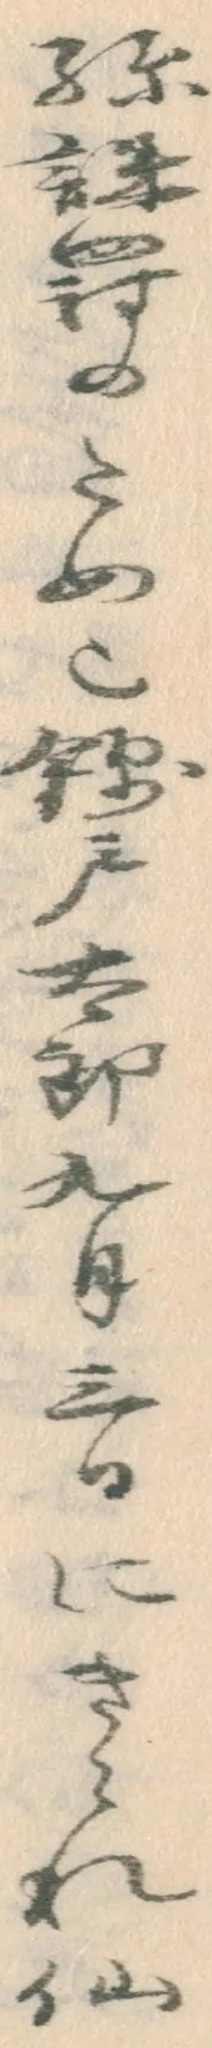孫誅罸のため也錦戸太郎九月三日にきられ仙
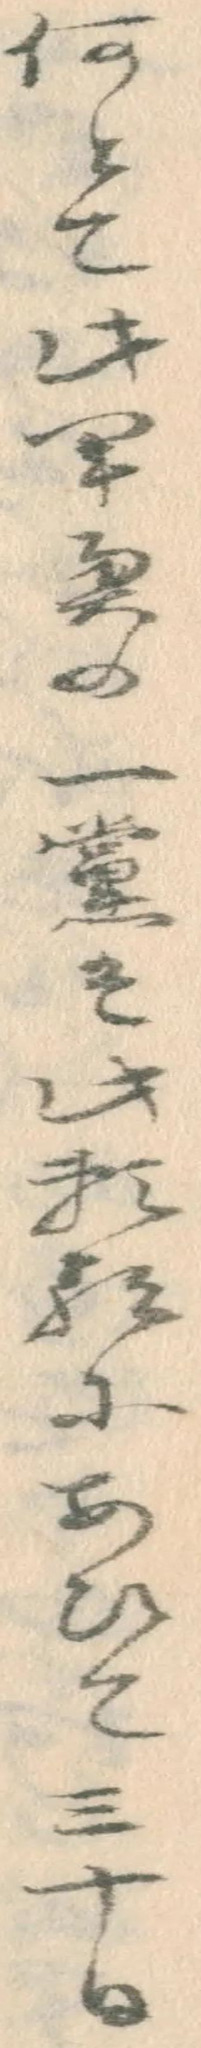何とて此軍奥の一黨は頼朝にあひて三十日
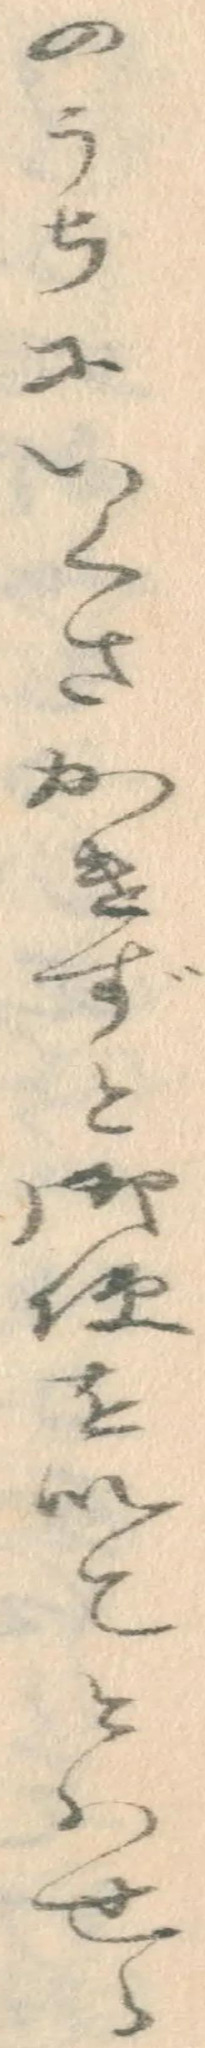のうちにいくさかけずと御使を以てとはせら

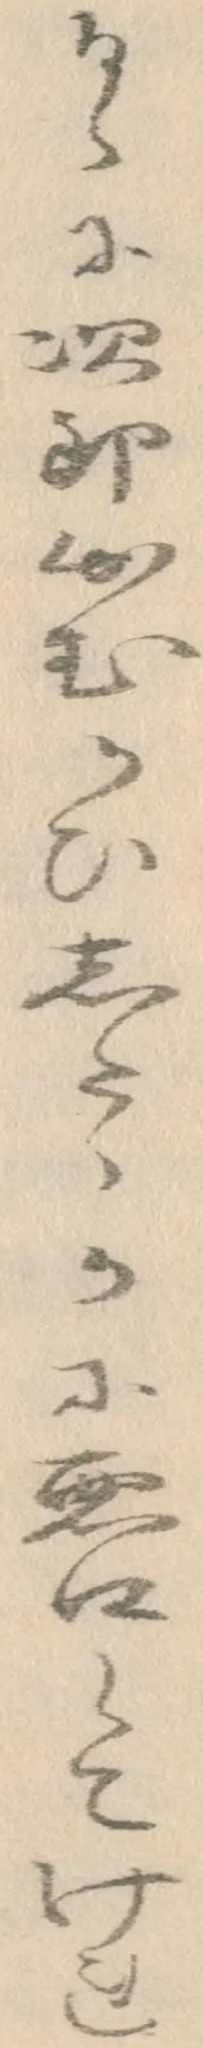るゝに次郎出むかひしたゝかに悪口してけれ
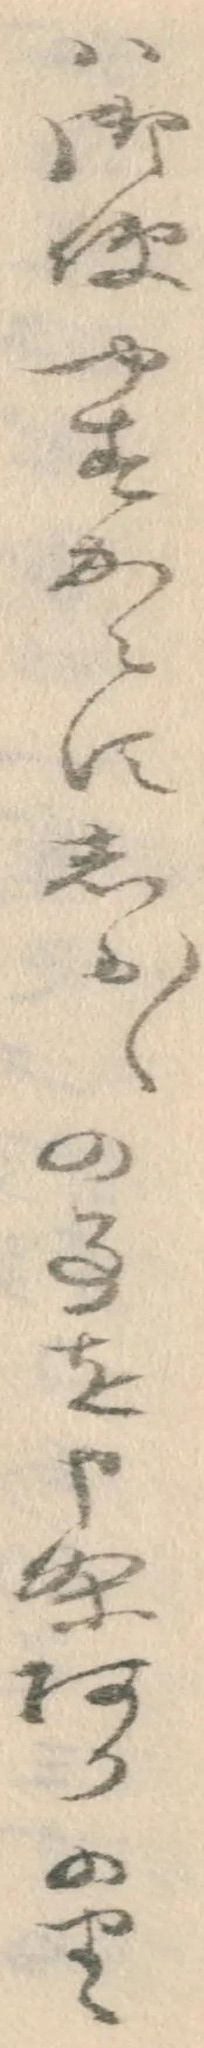は御使やすからすしか〳〵の事を申条ありのまゝ
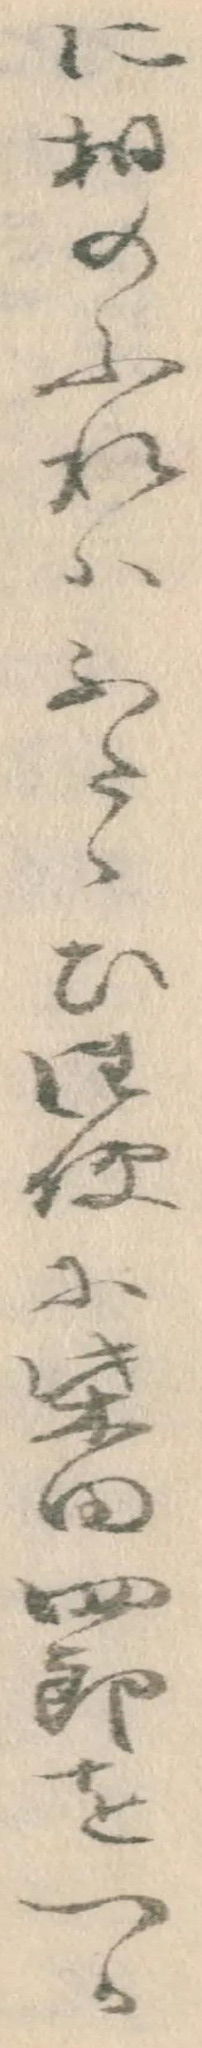に相のふれはふたゝひ御使に柴田四郎をつか
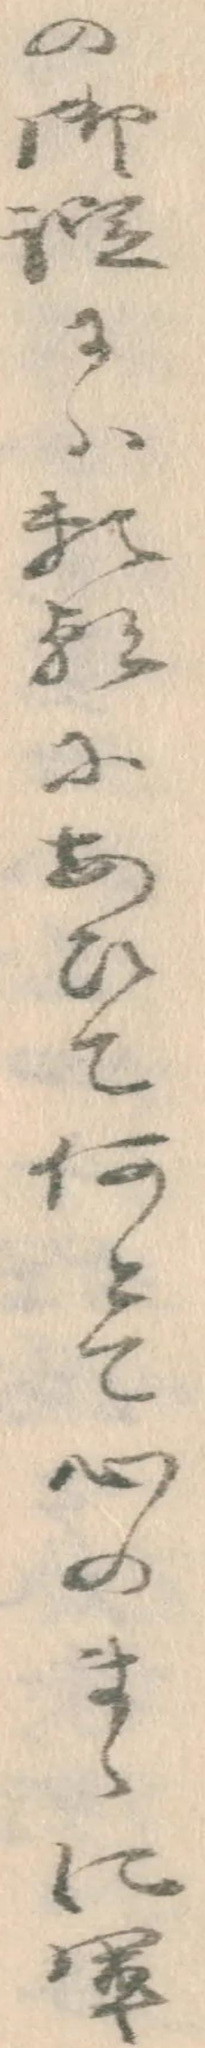の御諚には頼朝にあひて何とて心のまゝに軍
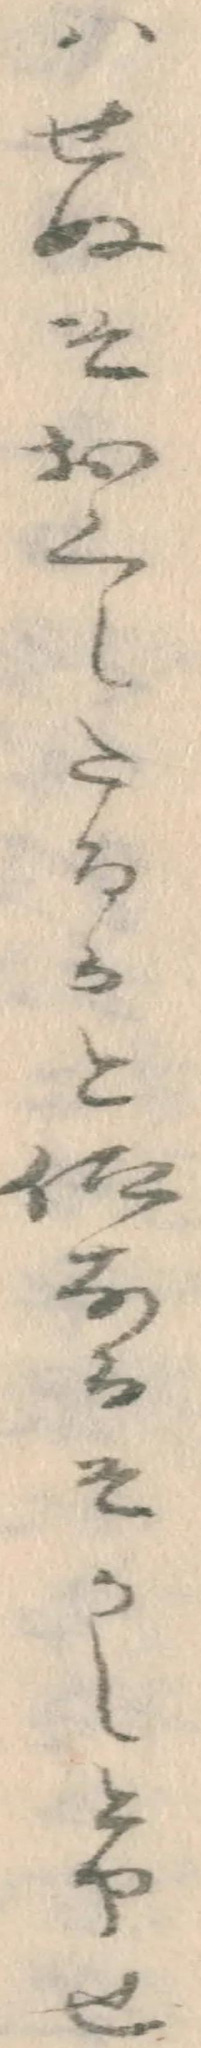はせぬそおくしたるかと仰なるそかしと申せ
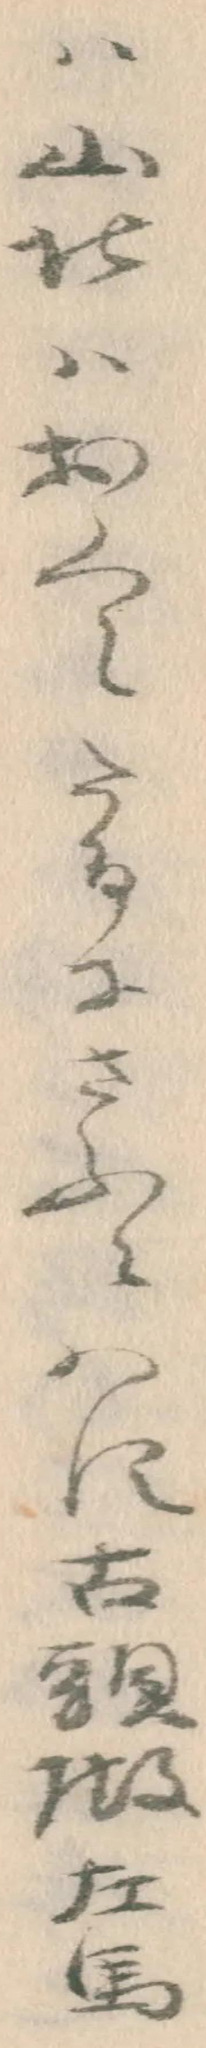は山北はおくしたるにさうらはす古頭殿左馬
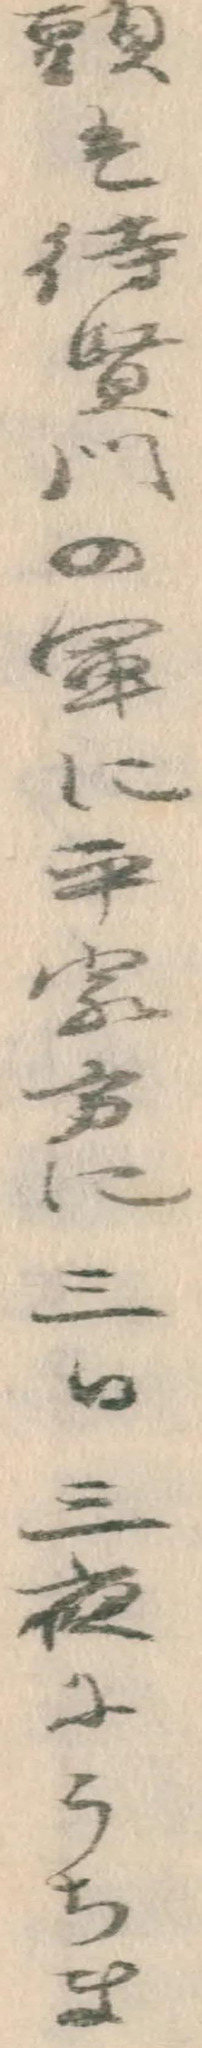頭は待賢門の軍に平家方に三日三夜にうちま
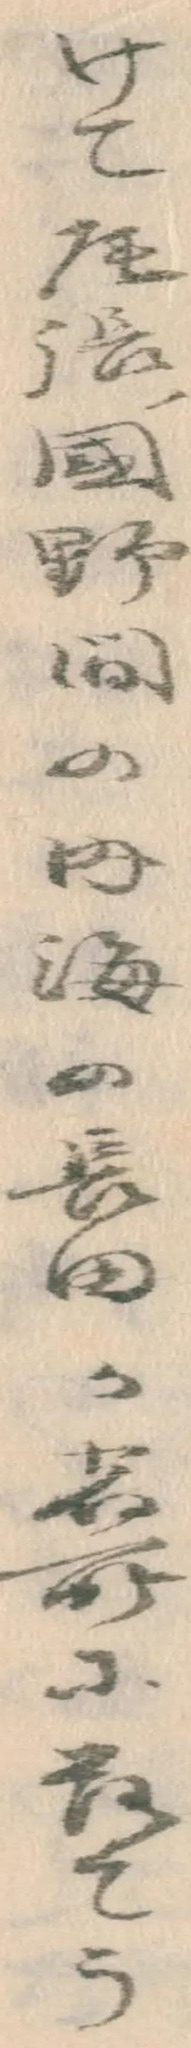けて尾張國野間の内海の長田か宿所に落てう
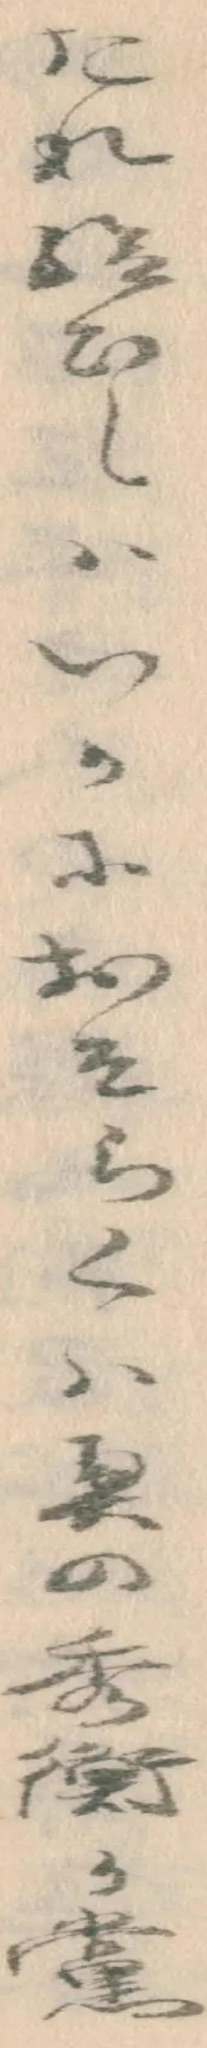たれ給ひしはいかにおそらくは奥の秀衡か黨
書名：眞澄遊覽記[第2冊]
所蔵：国立国会図書館 National Diet Library, JAPAN
